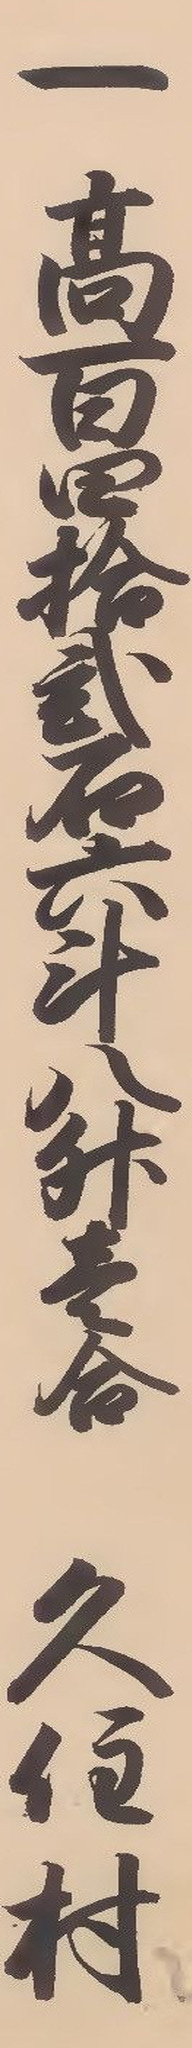一高百四拾弐石六斗八升壱合久住村
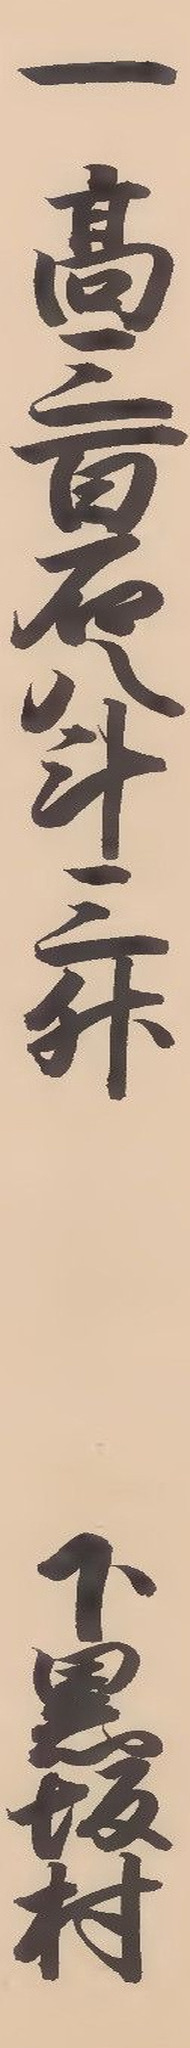一高三百石八斗三升下黒坂村
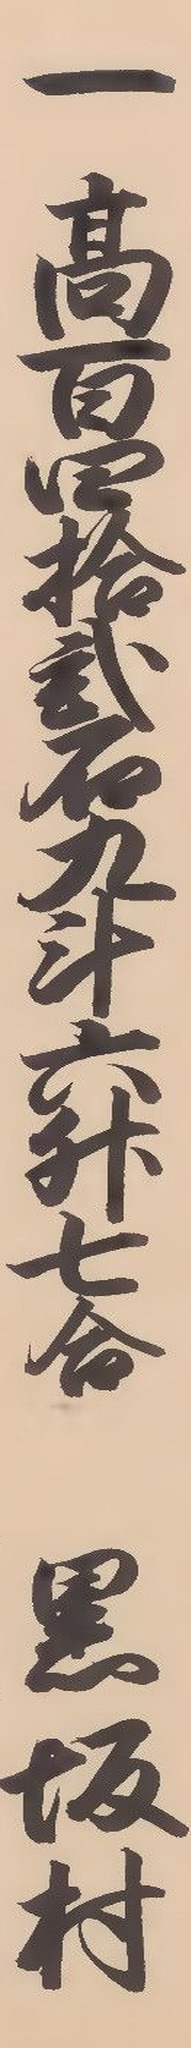一高百四拾弐石九斗六升七合黒坂村
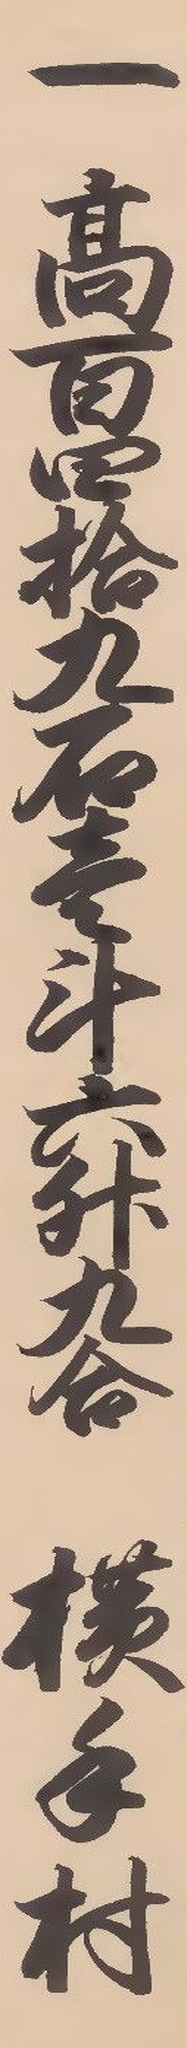一高百四拾弐石九斗六升七合黒坂村
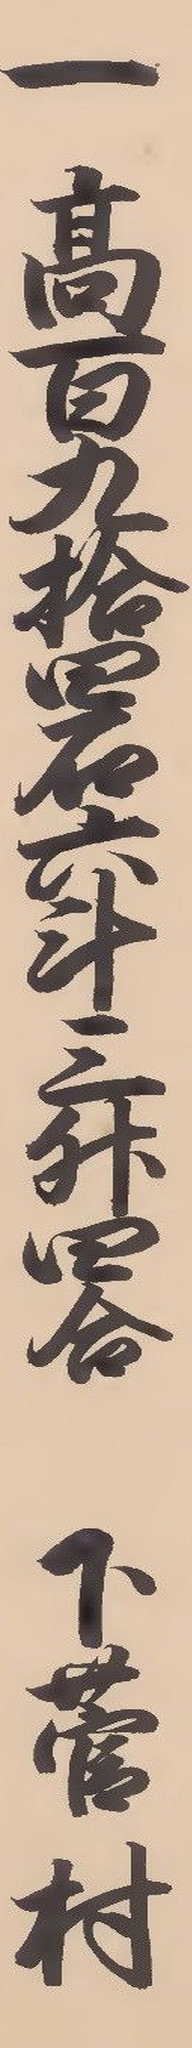一高百九拾四石六斗三升四合下菅村
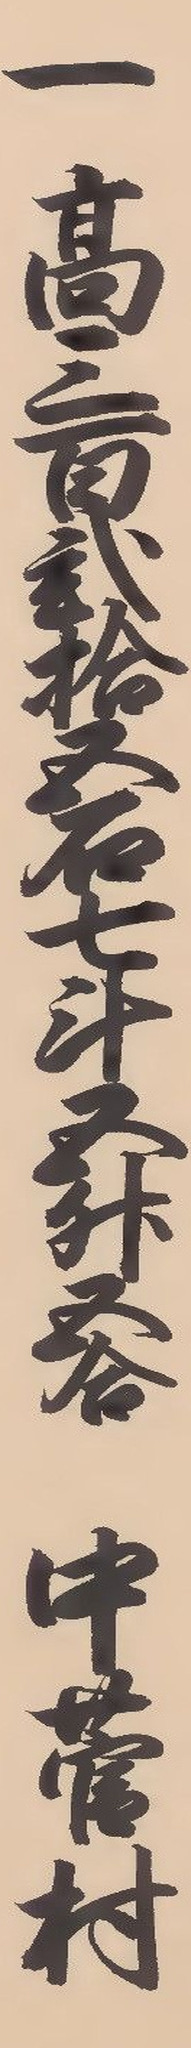一高三百弐拾五石七斗五升五合中菅村
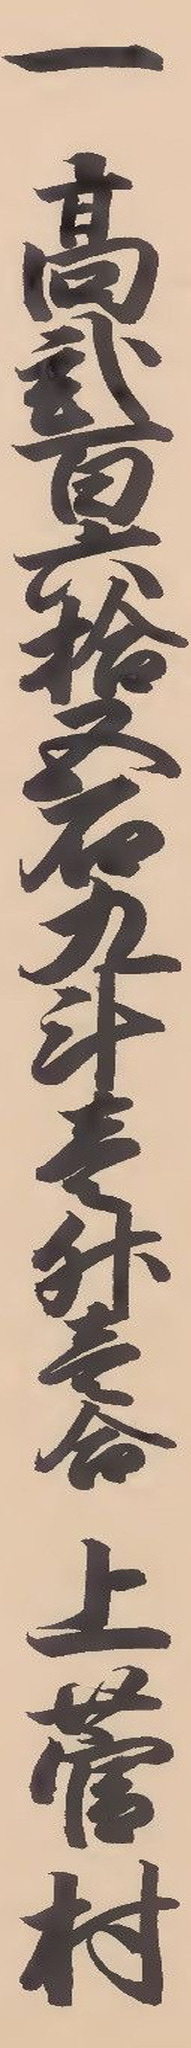一高弐百六拾五石九斗壱升壱合上菅村
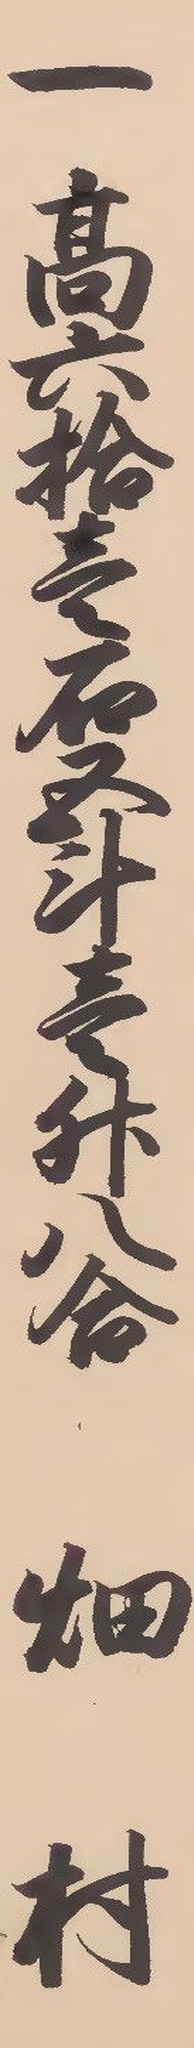一高六拾壱石五斗壱升八合畑村

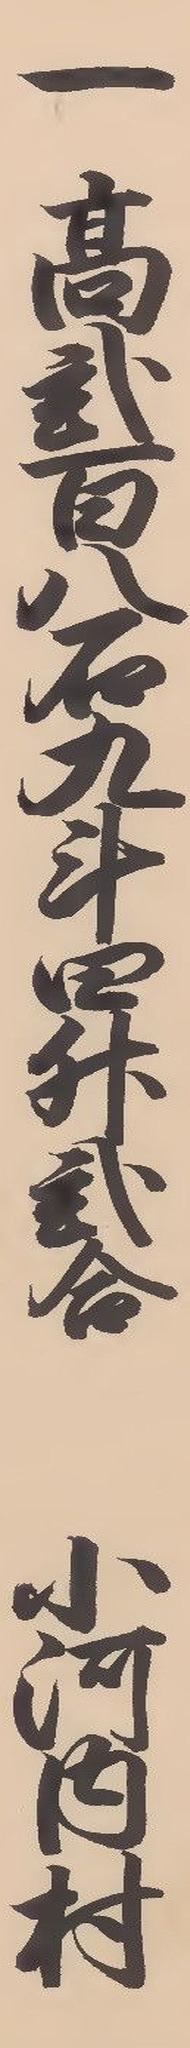一高弐百八石九斗四升弐合小河内村
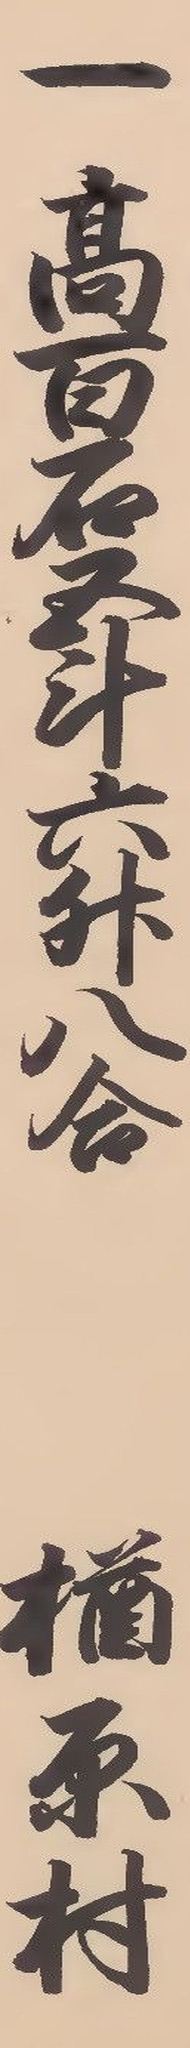一高百石五斗六升八合楢原村
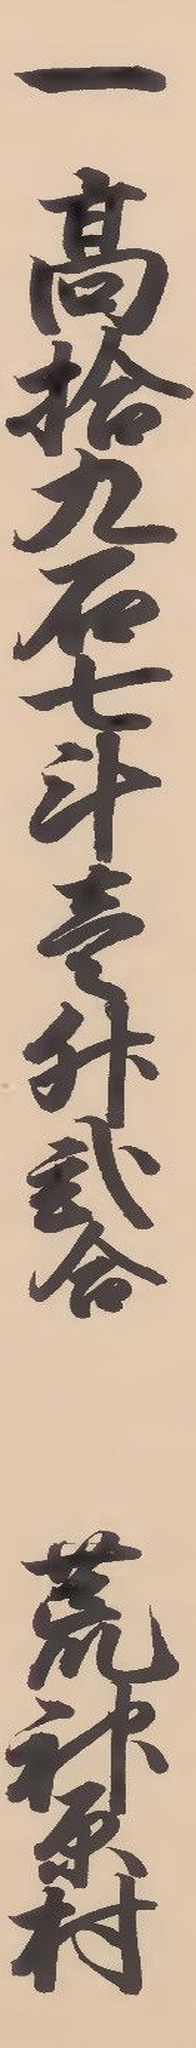一高拾九石七斗壱升弐合荒神原村
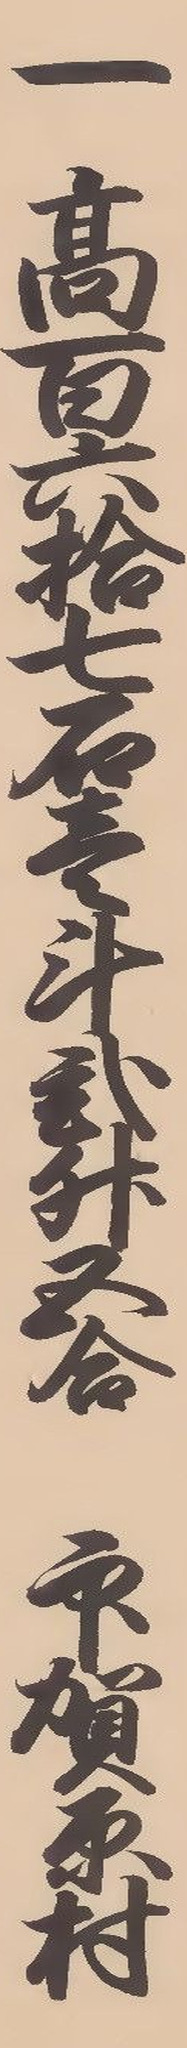一高百六拾七石壱斗弐升五合印賀原村
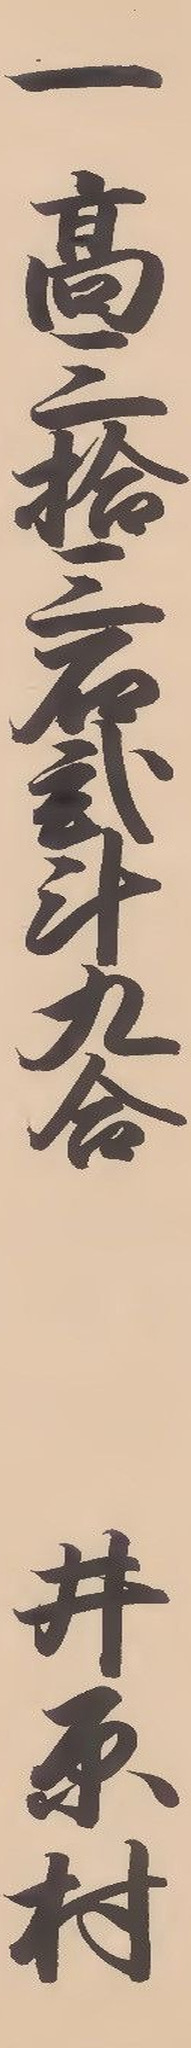一高三拾三石弐斗九合井原村
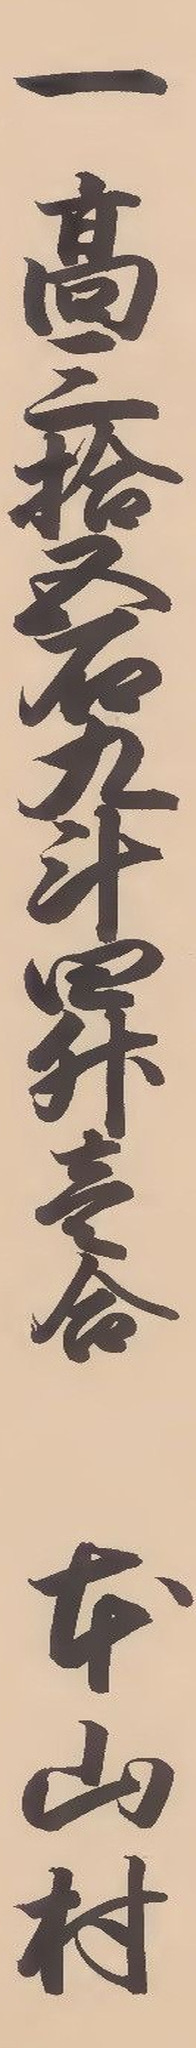一高三拾五石九斗四升壱合本山村
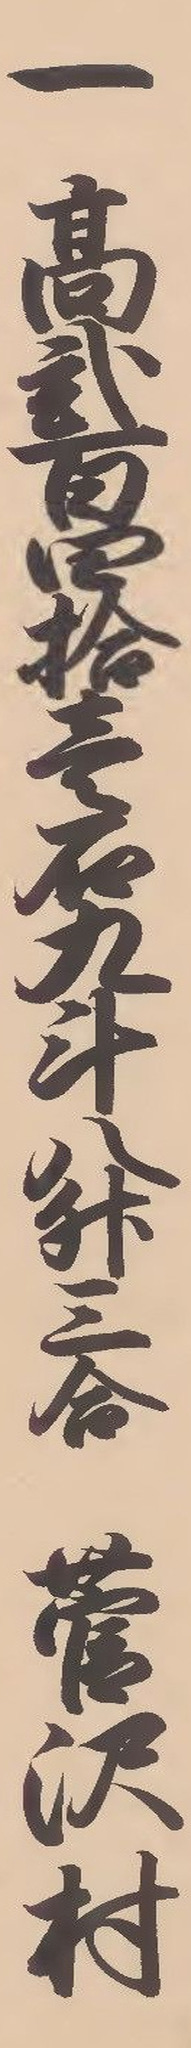一高弐百四拾壱石九斗八升三合菅沢村

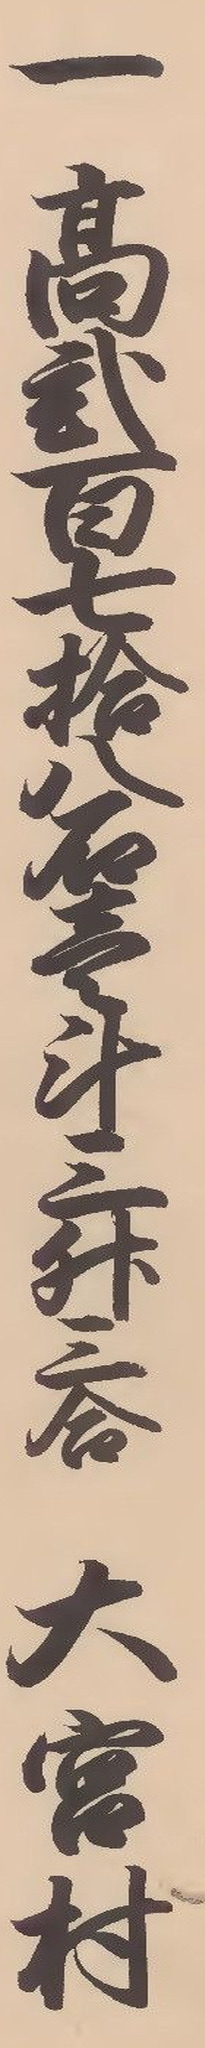一高弐百七拾八石壱斗三升三合大宮村
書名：伯耆国郷帳
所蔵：国立公文書館 National Archives of Japan
